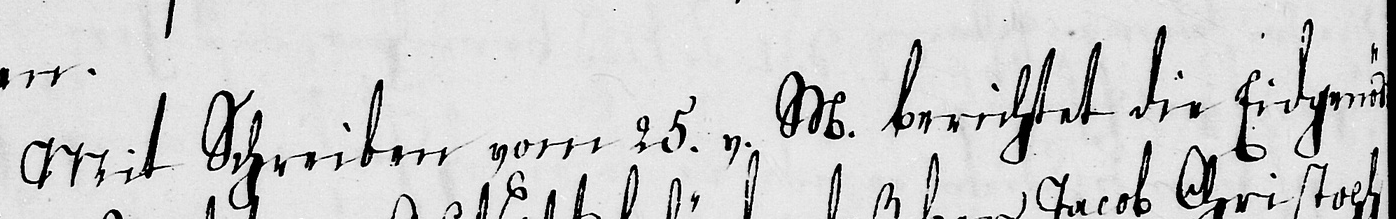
Mit Schreiben vom 25. v. M. berichtet die Eidgen¬
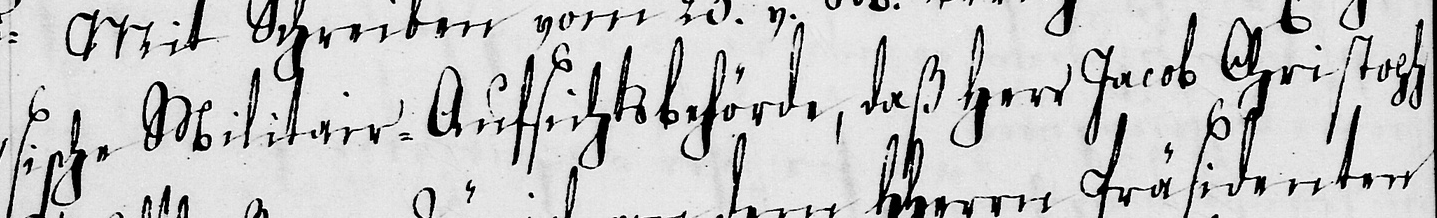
ische Militair-Aufsichtsbehörde, daß Herr Jacob Christoph
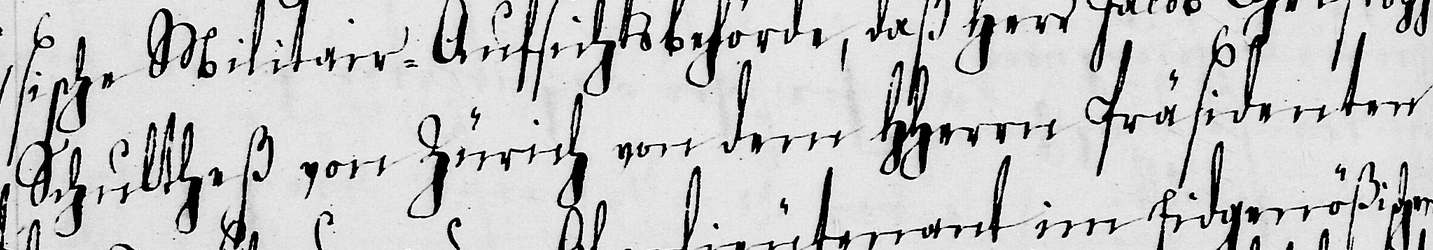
Schultheß von Zürich von dem HHerrn Präsidenten
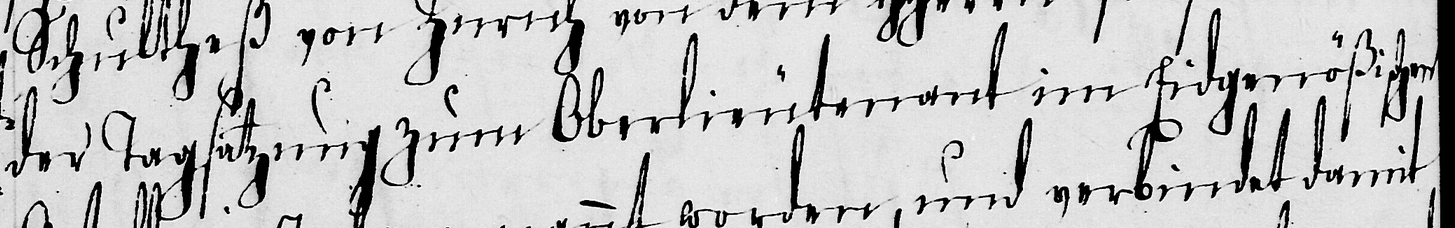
der Tagsatzung zum Oberlieutenant im Eidgenößischen
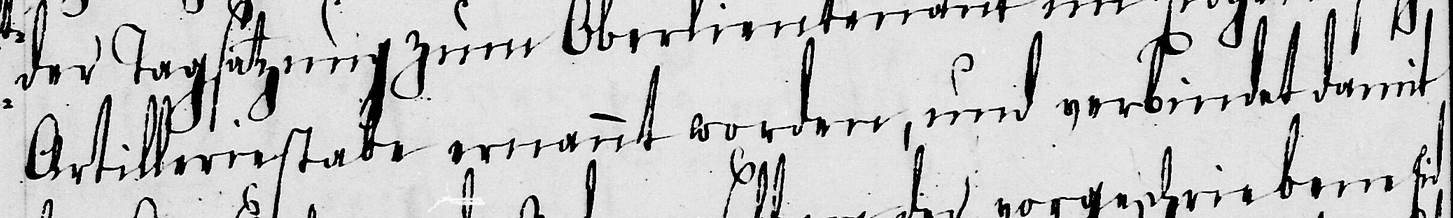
Artilleriestabe ernannt worden, und verbindet damit
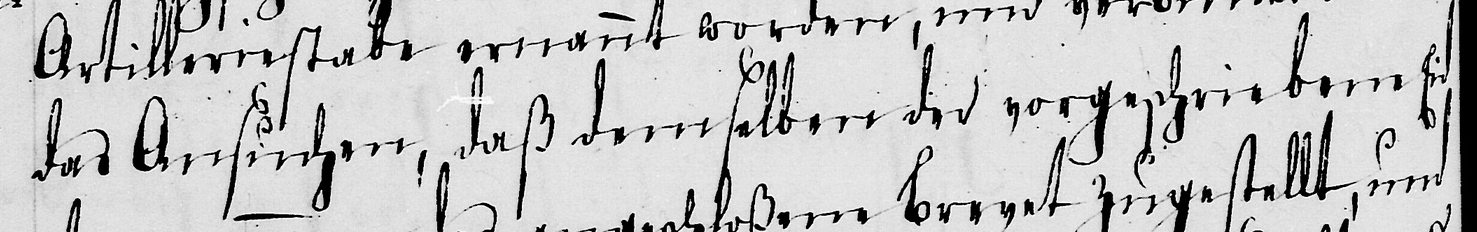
das Ansuchen, daß demselben der vorgeschriebene Eid
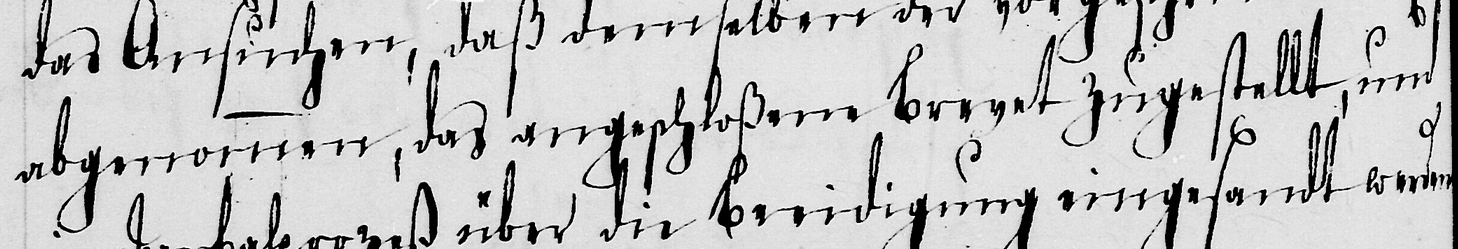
abgenommen, das angeschloßene Brevet zugestellt, und
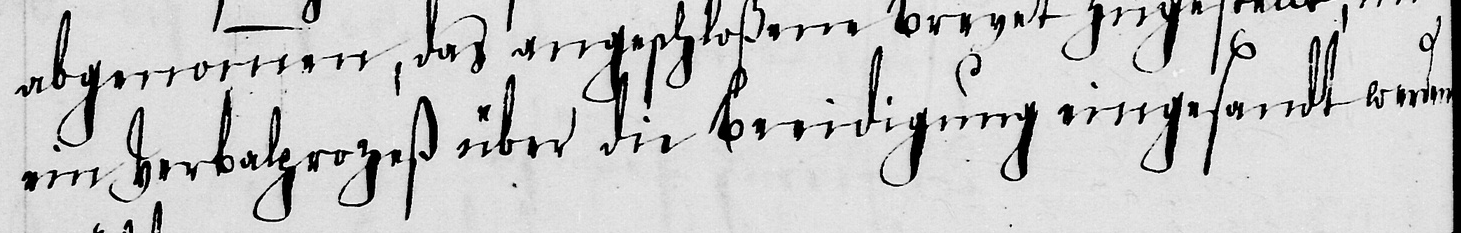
ein Verbalprozeß über die Beeidigung eingesandt werd¬
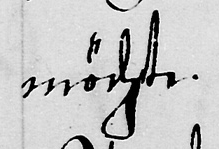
möchte.
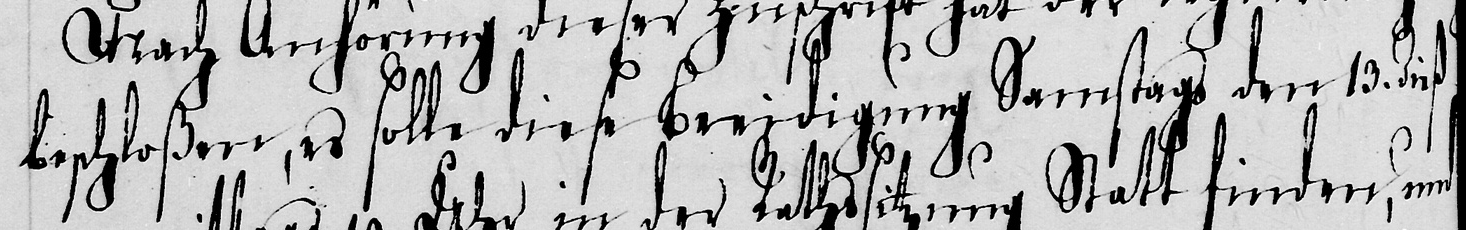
beschloßen, es solle diese Beeidigung Samstags den 13. di¬
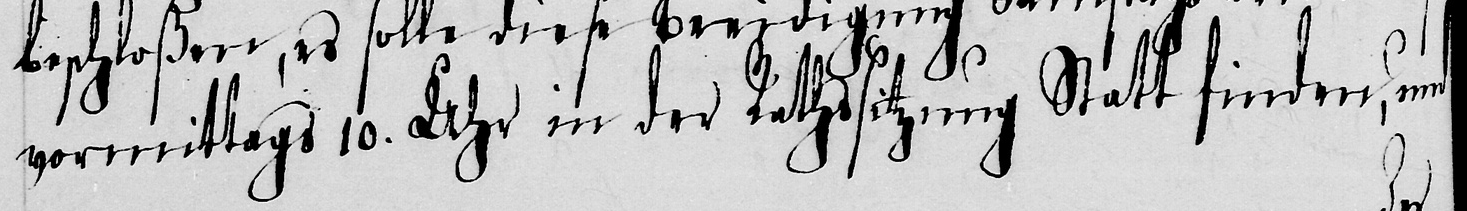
vormittags 10. Uhr in der Rathssitzung Statt finden, und
